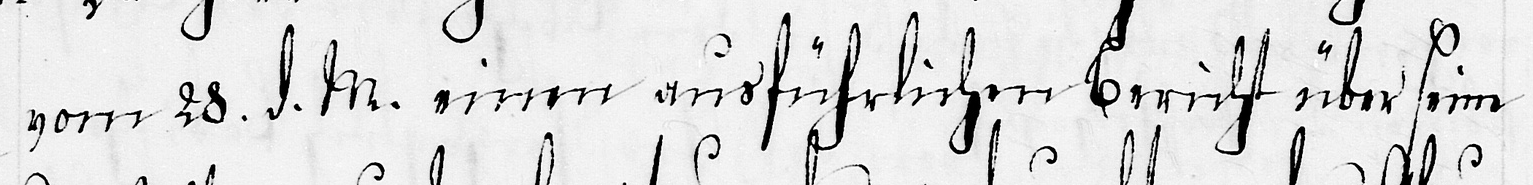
vom 28. d. M. einen ausführlichen Bericht über seine
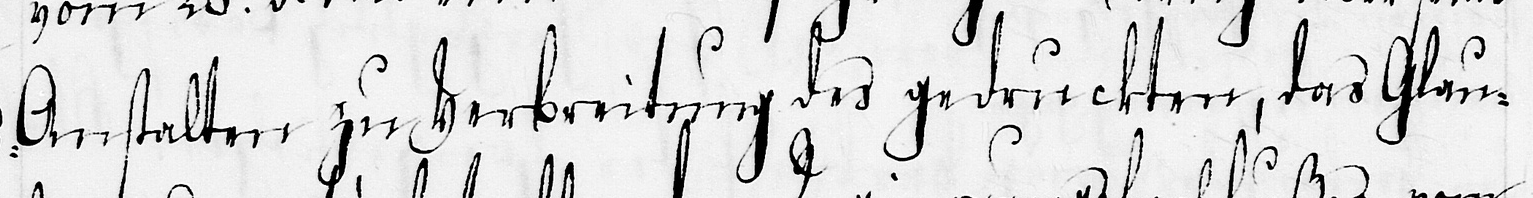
Anstalten zu Verbreitung des gedruckten, das Glau¬
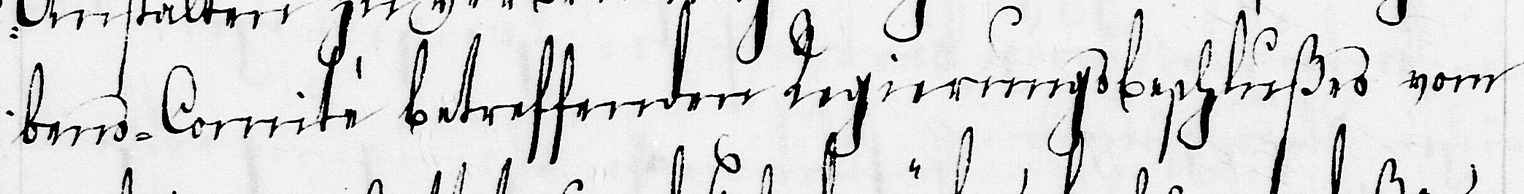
bens-Comité betreffenden Regierungsbeschlußes vom
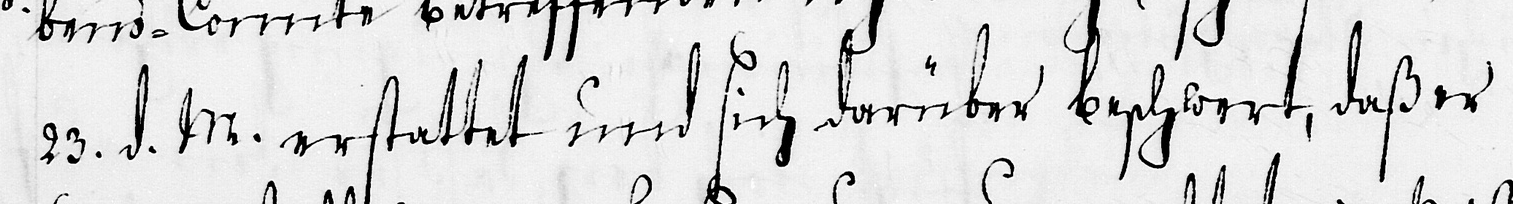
23. d. M. erstattet und sich darüber beschwert, daß er
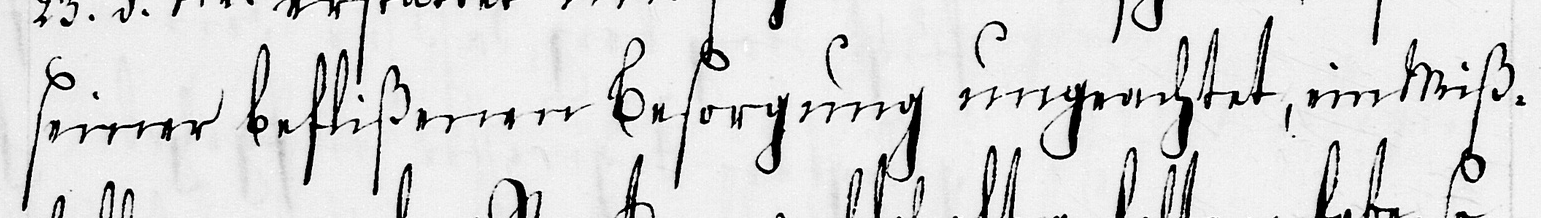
seiner beflißenen Besorgung ungeachtet, ein Miß¬
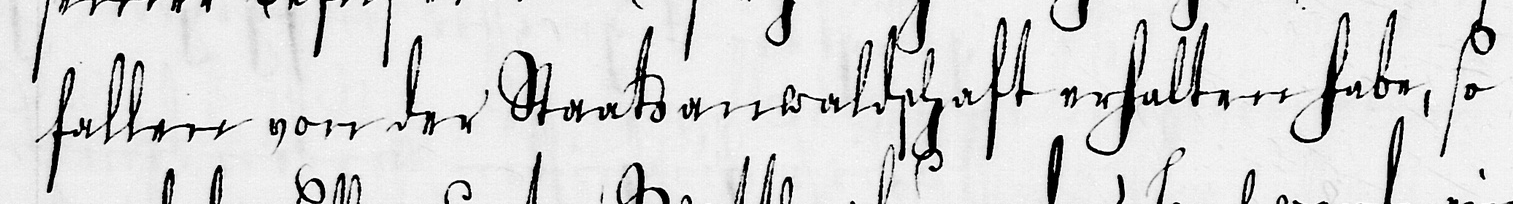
fallen von der Staatsanwaldschaft erhalten habe, so
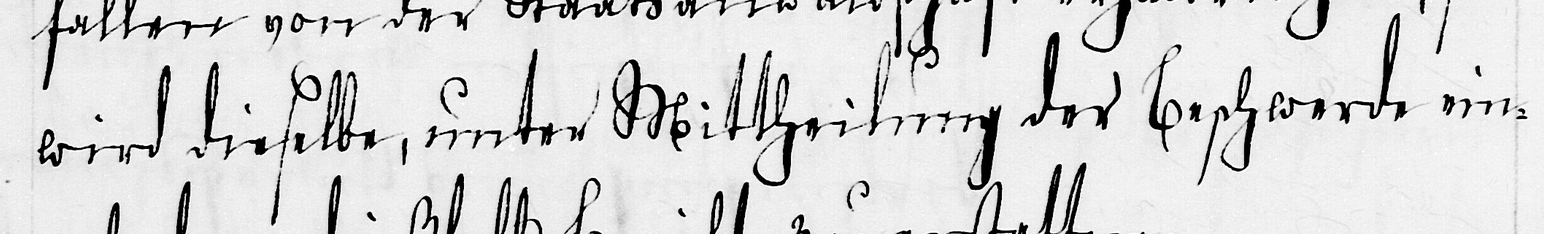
wird dieselbe, unter Mittheilung der Beschwerde ein¬
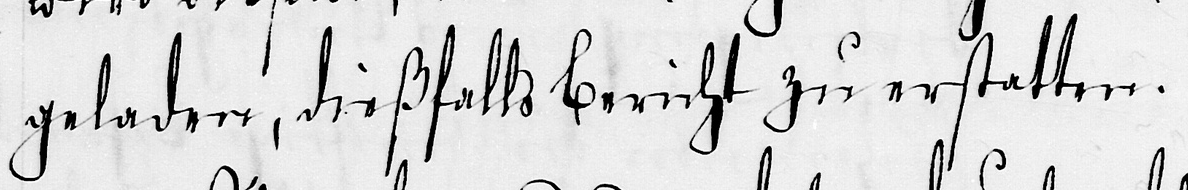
geladen, dießfalls Bericht zu erstatten.
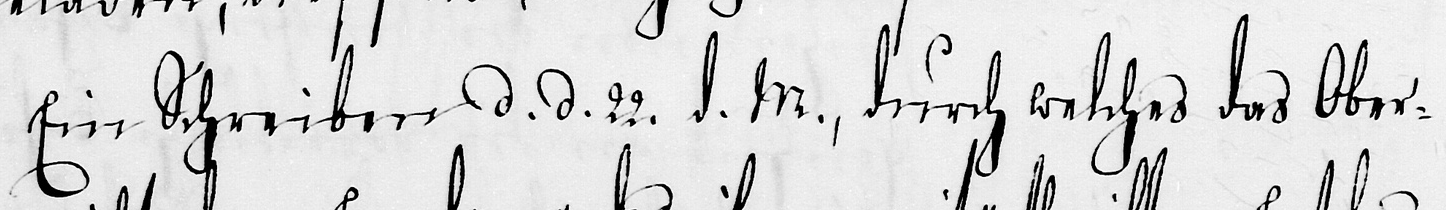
Ein Schreiben d. d. 22. d. M., durch welches das Ober¬
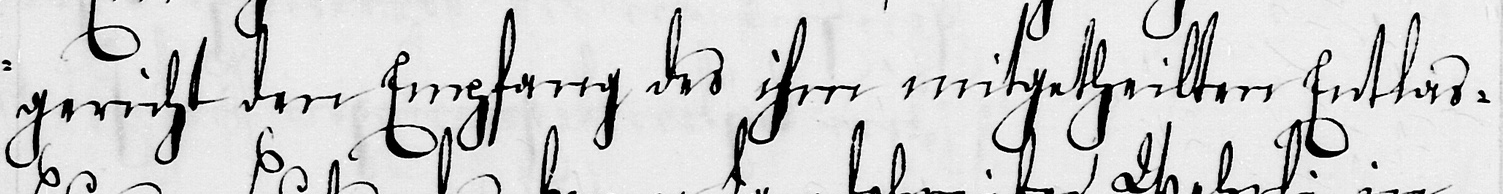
gericht den Empfang des ihm mitgetheilten Entlaß¬
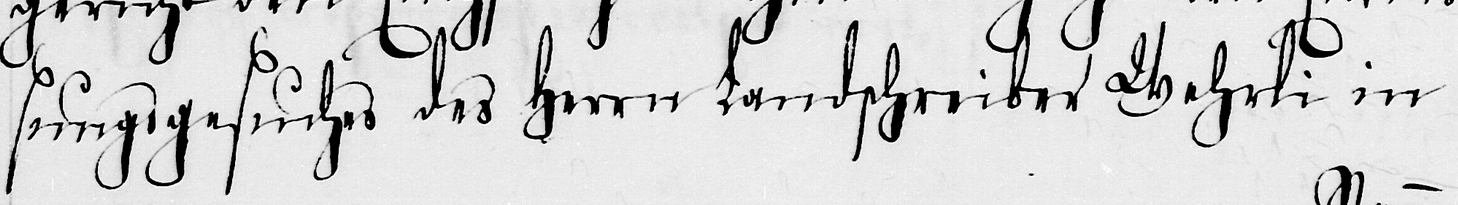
ungsgesuches des Herrn Landschreiber Wehrli in
